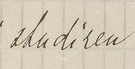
studiren, statt
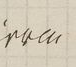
eingebildete
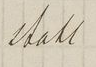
Herr
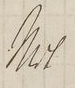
die
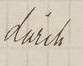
erste
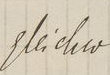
Anfechtung
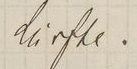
dürfte.
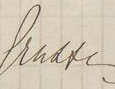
Grusse
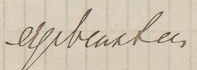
ergebenster
